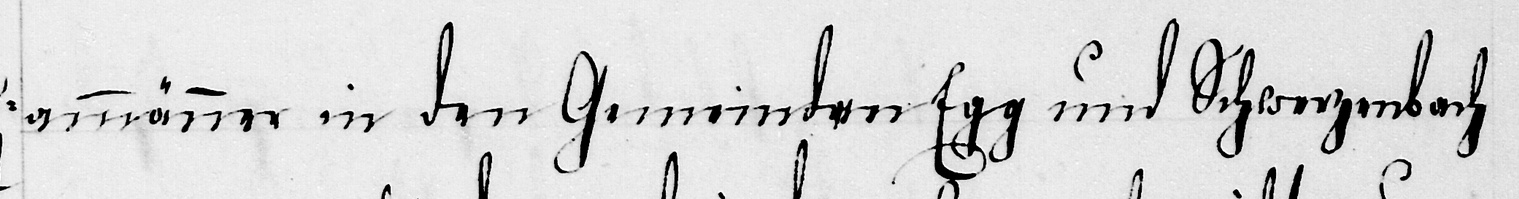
ammänner in den Gemeinden Egg und Schwerzenbach
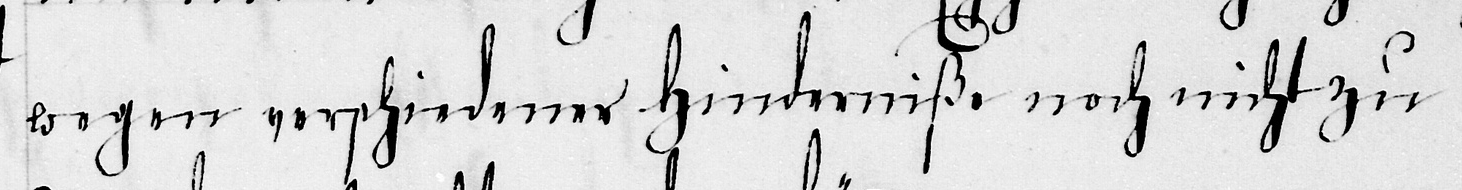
wegen verschiedener Hinderniße noch nicht zu
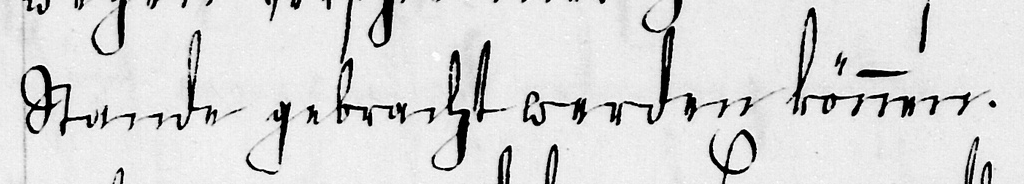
Stande gebracht werden können.
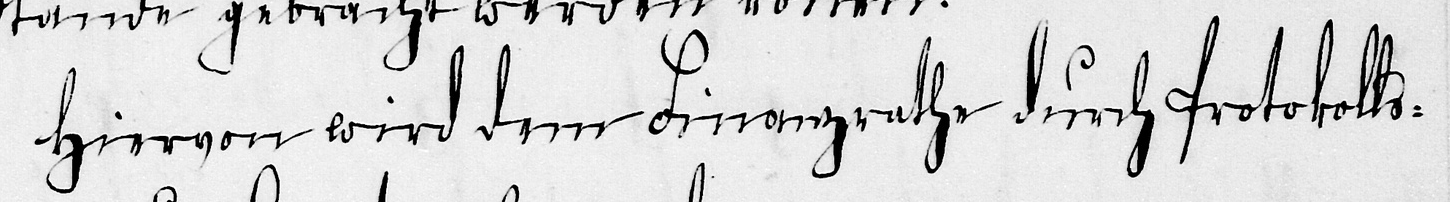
Hiervon wird dem Finanzrathe durch Protokoll¬
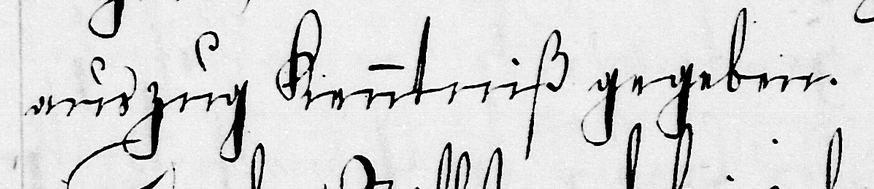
sauszug Kenntniß gegeben.
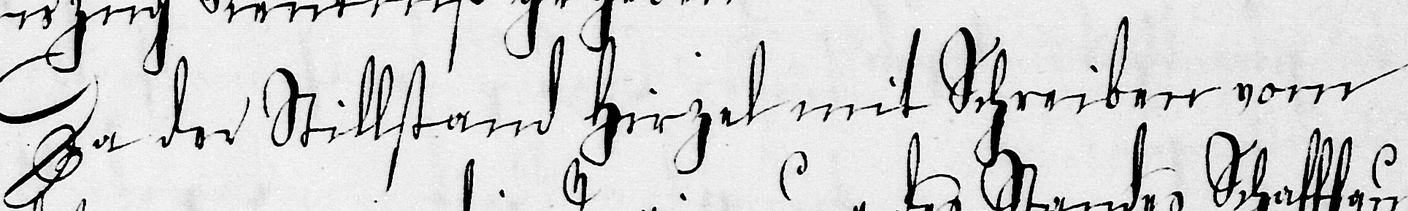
Da der Stillstand Hirzel mit Schreiben vom
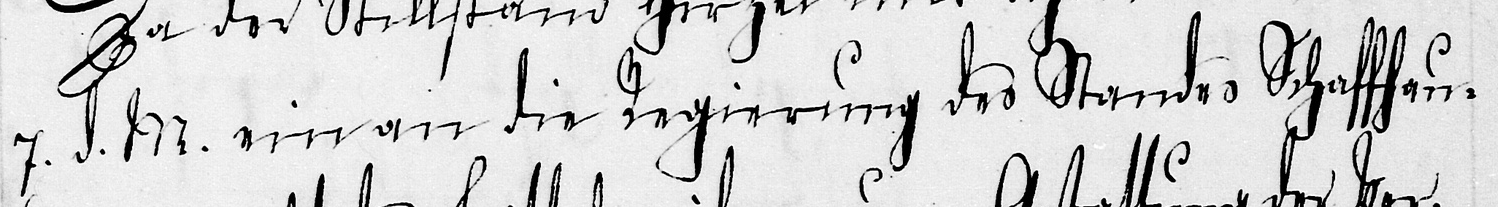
7. d. M. ein an die Regierung des Standes Schaffhau¬
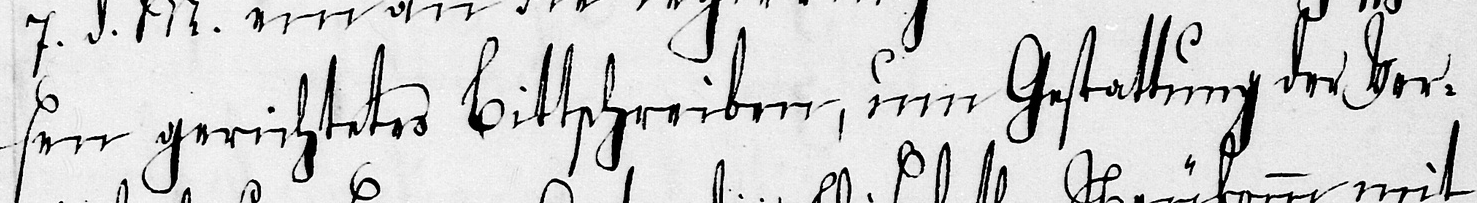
sen gerichtetes Bittschreiben, um Gestattung der Ver¬
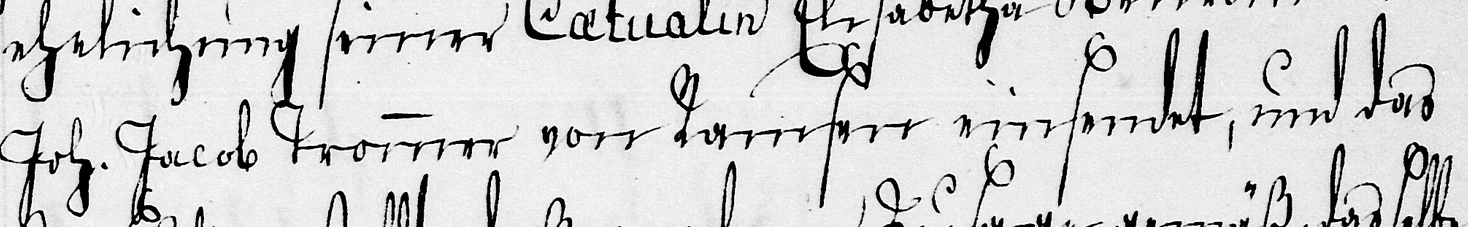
Joh. Jacob Trommer von Ramsen einsendet, und das
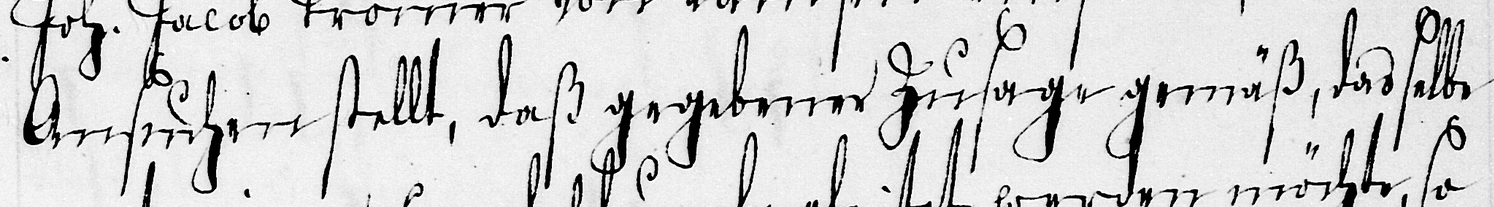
Ansuchen stellt, daß gegebener Zusage gemäß, dasselbe
